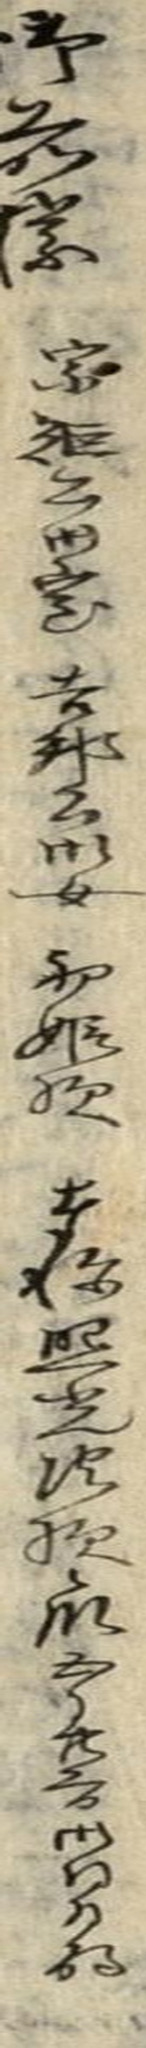一御前様宗矩公御室吉邦公御女初姫様奉称照光院様候段五月廿二日御目付触
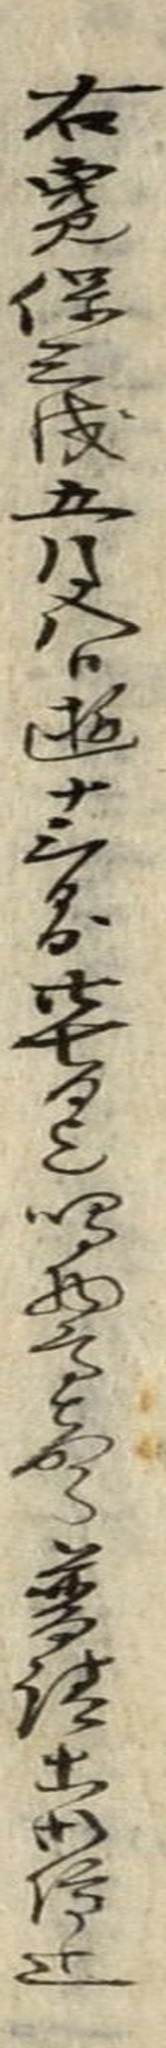右寛保三戌五月八日逝十三日ゟ廿七日迄鳴物高声普請等御停止
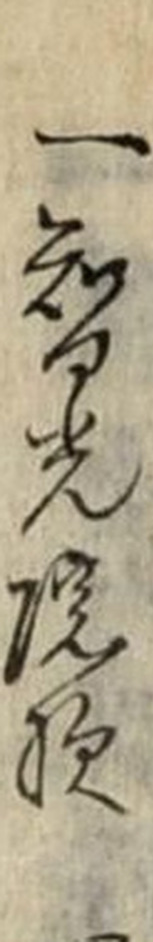一昇安院様
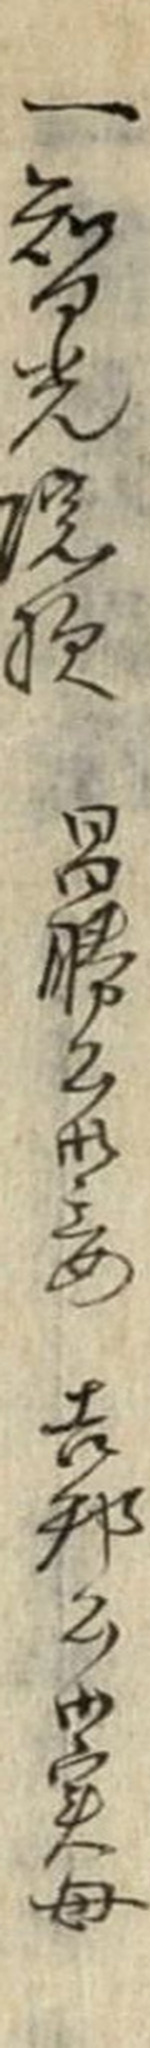一智光院様昌勝公御妾吉邦公御実母
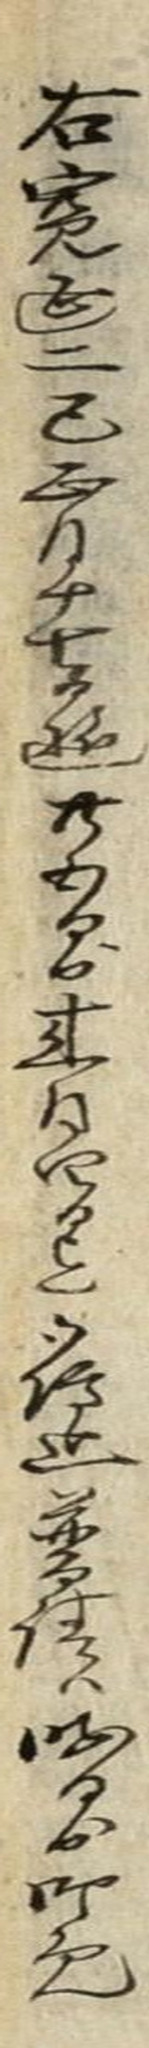右寛延二巳正月十七日逝廿五日ゟ来月四日迄御停止普請は晦日ゟ御免
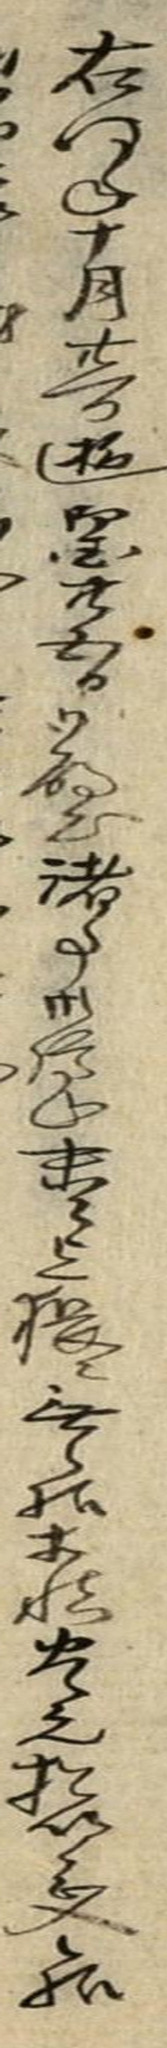右同年十月廿一日逝御国廿五日御触出諸事御停止末々迄猥に無之様相慎火之元猶以念入候様
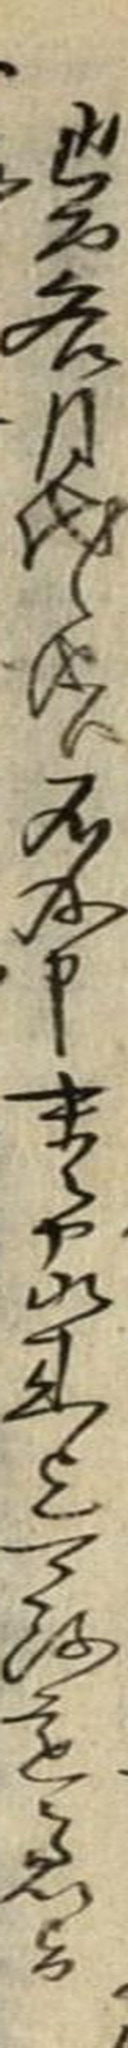追て各月代之儀は不及申末々家来迄可致遠慮旨
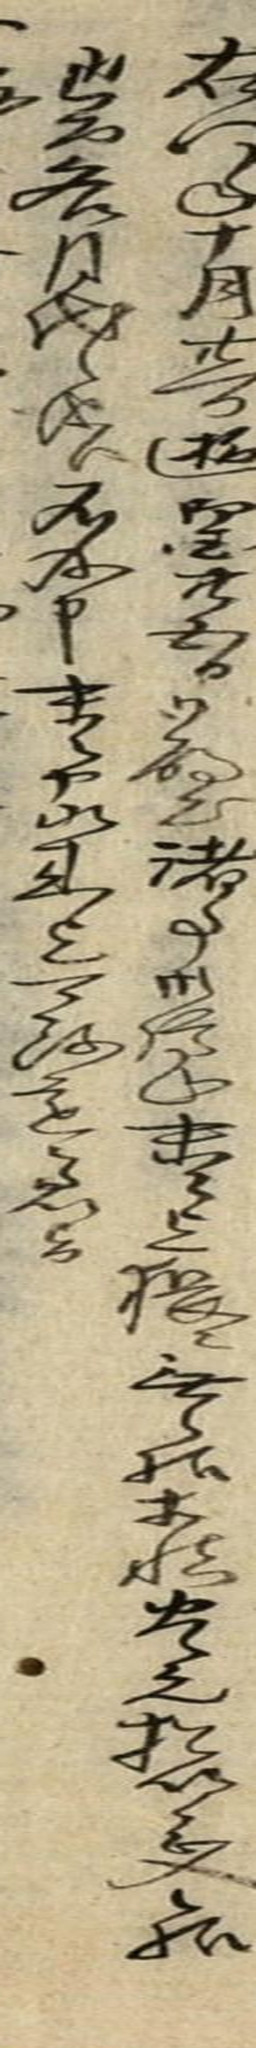追て各月代之儀は不及申末々家来迄可致遠慮旨
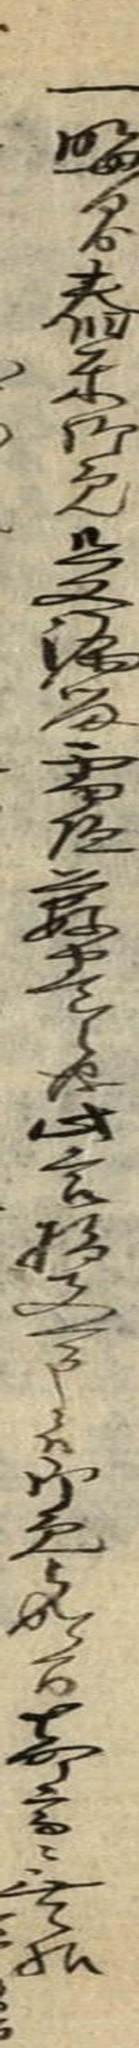一晦日ゟ舂米御免且又漏留雪垣薮巻之儀此節指支可申に付御免被成候間声高に無之様可申付旨
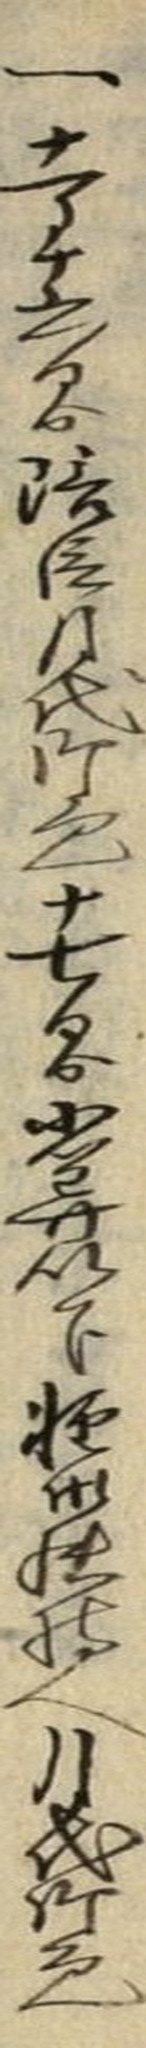一十一月十六日ゟ陪臣月代御免十七日ゟ小算以下軽御扶持人月代御免
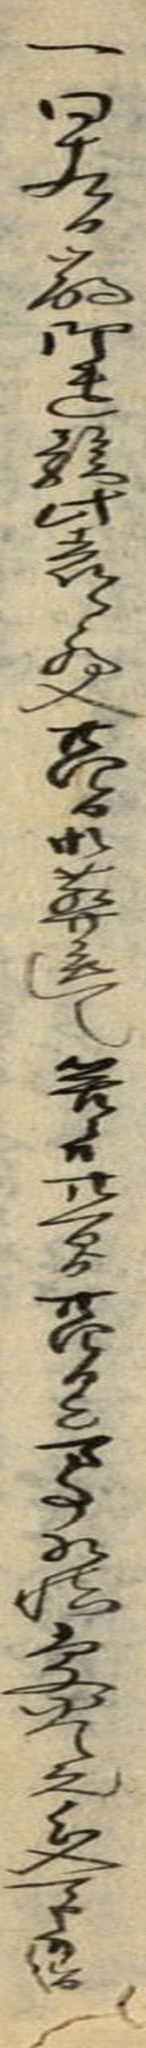一同十九日御触御遺骸此表へ被為入廿四日御葬送之筈に付廿一日ゟ廿四日迄万事相慎尚又火之元念入可申付旨
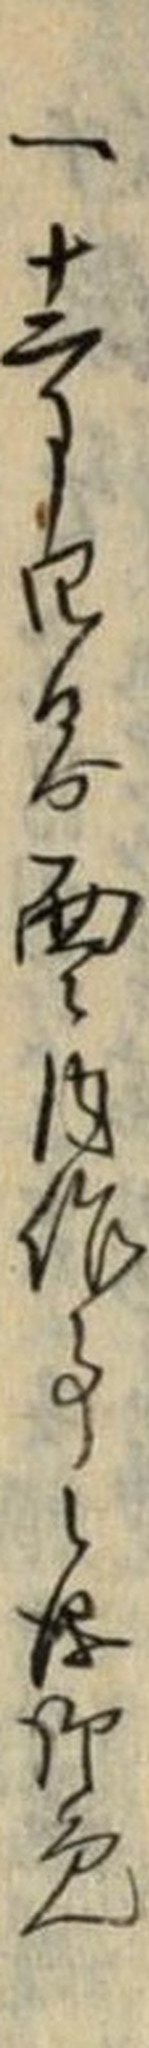一十二月四日ゟ面々内作事之儀御免
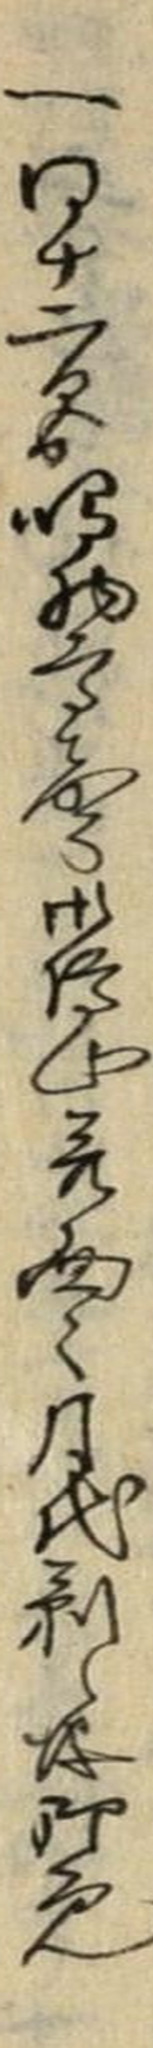一同十二日ゟ鳴物高声御停止并面々月代剃之儀御免
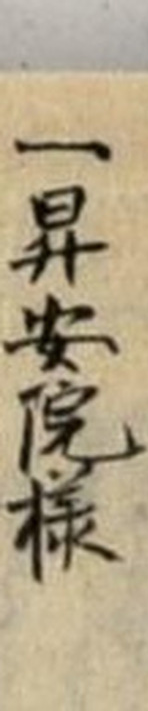一昇安院様
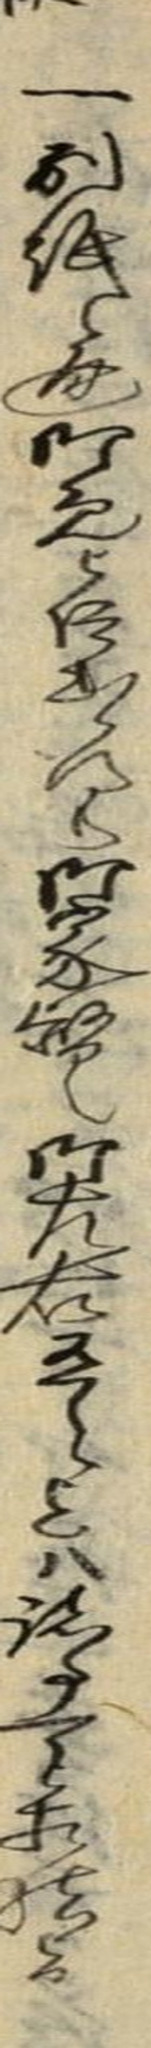一別紙之通御免被仰出候得共御家督之御左右有之迄は諸事可被相慎旨
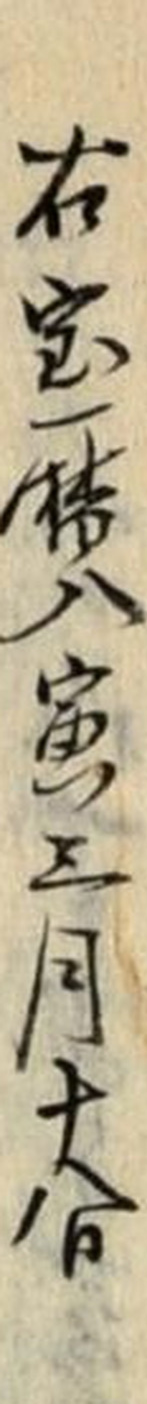右宝暦八寅三月十八日
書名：御停止異変死失
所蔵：福井県文書館 Fukui Prefectural Archives
